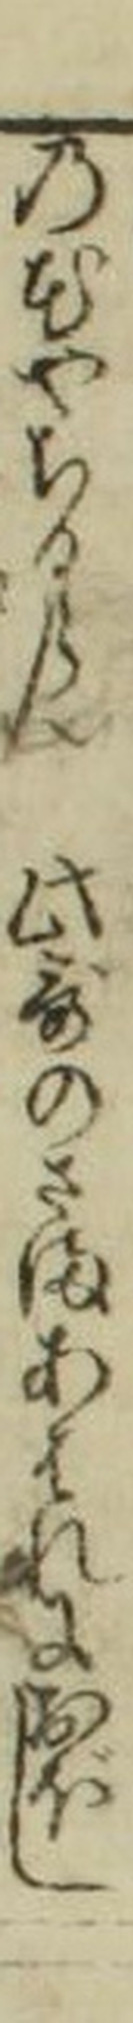の花やちるらん此哥のさまあはれにおぼし
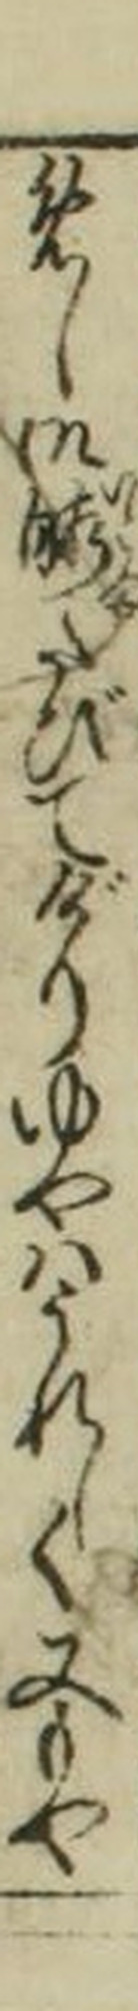めし御暇たびてげりゆやはうれしく又もや
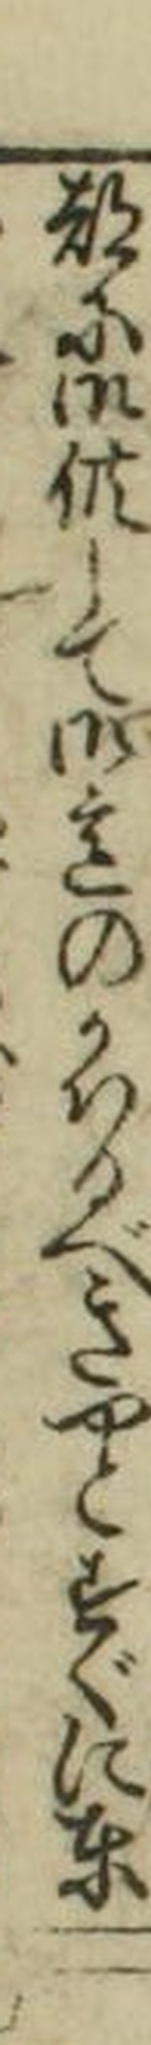都に御供して御意のかはるべきやとすぐに東に
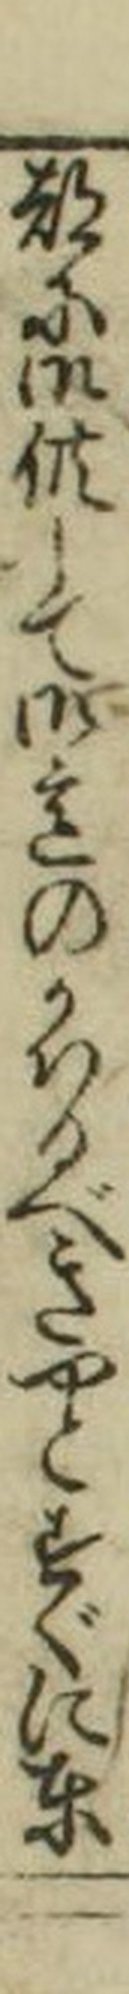都に御供して御意のかはるべきやとすぐに東に
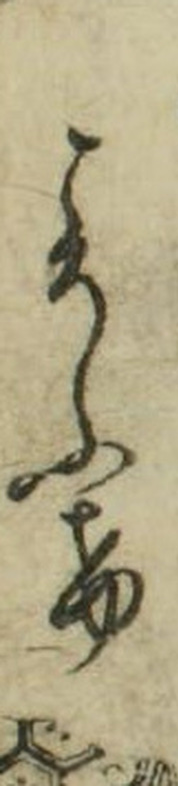こそふけ
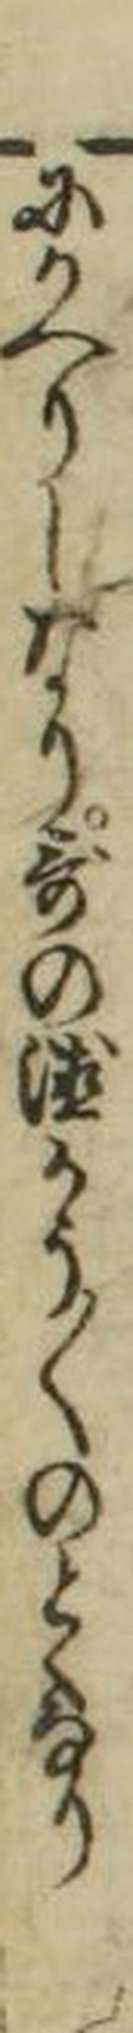にかへりしなり。哥の徳かう〳〵のとくなり

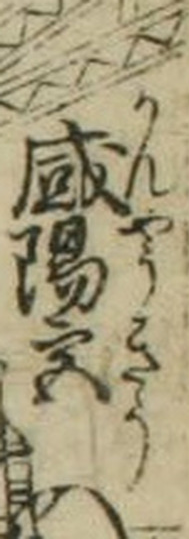感陽宮
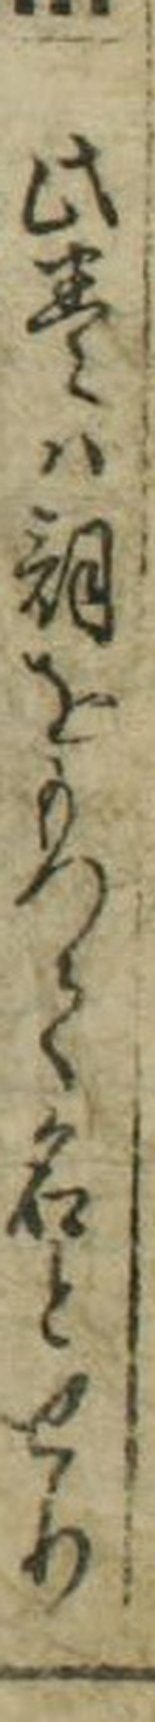此巻は詞をもつて名とせり
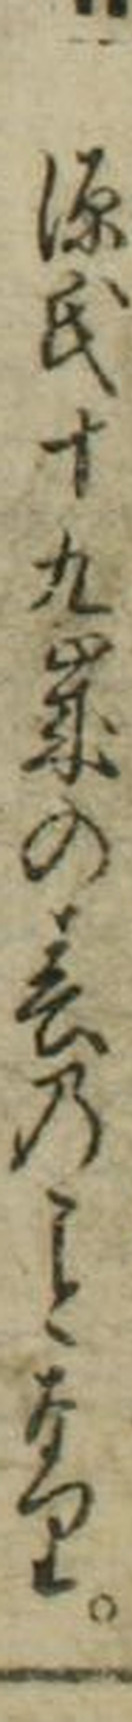源氏十九歳の春のことなり。
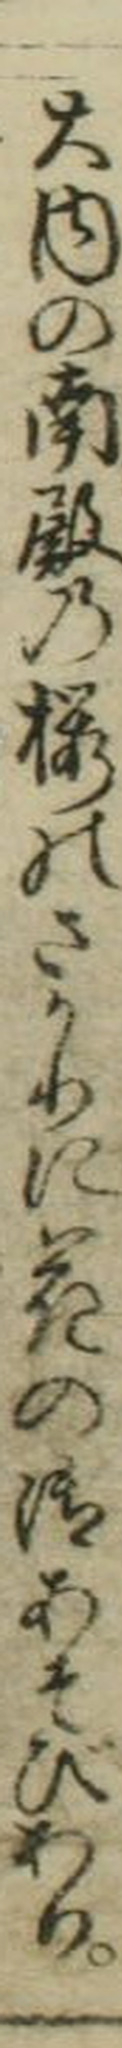大内の南殿の桜のさかりに花の御あそびあり。
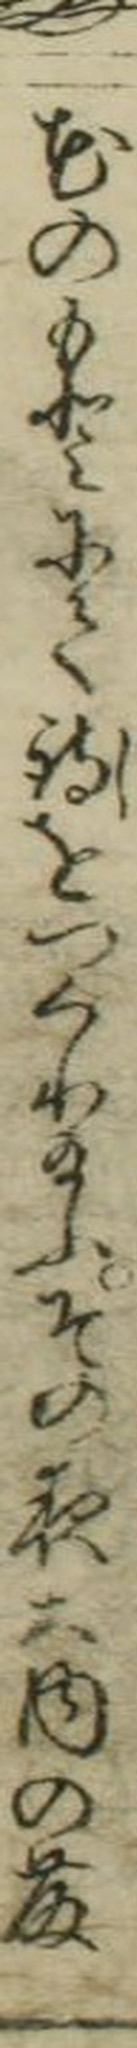花のもとにて詩をつくり給ふ。その夜大内の藤
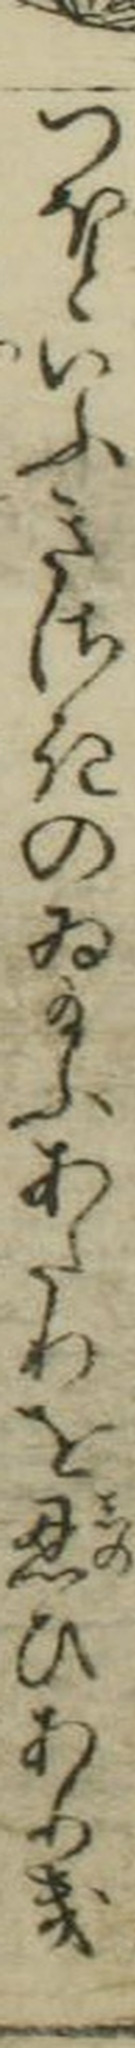つほといふきさきのゐ給ふあたりを忍ひありき
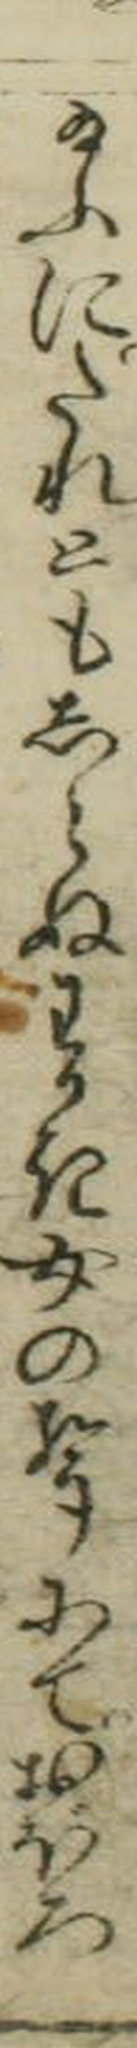給ふに。たれともしらぬわかき女の声にて。おぼろ
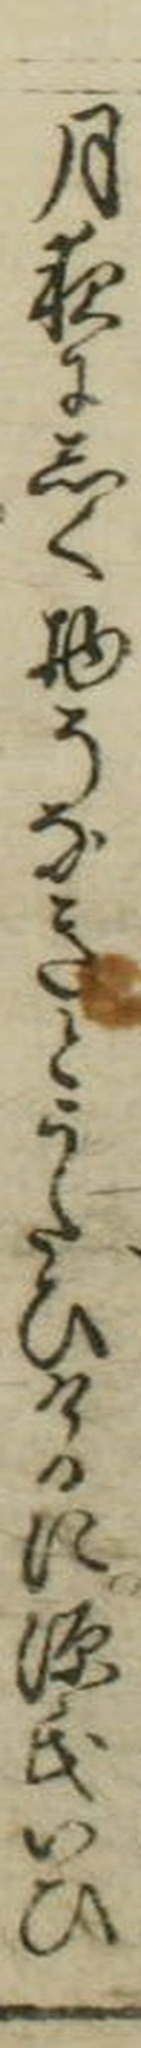月夜にしく物そなきとうたひけるに。源氏いひ
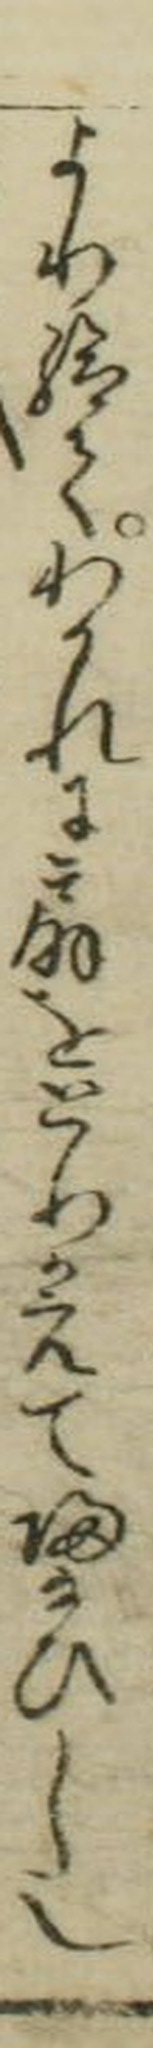より給て。わかれに扇をとりかえて帰給ひし也
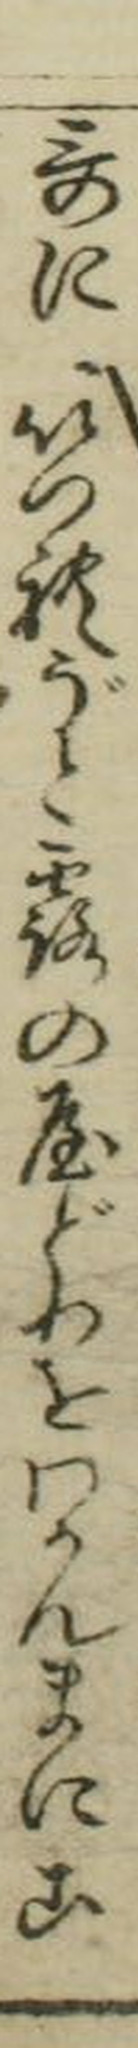哥に〽いつれぞと露のやどりをわかんまにこ
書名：女源氏教訓鑑
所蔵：東京学芸大学附属図書館
